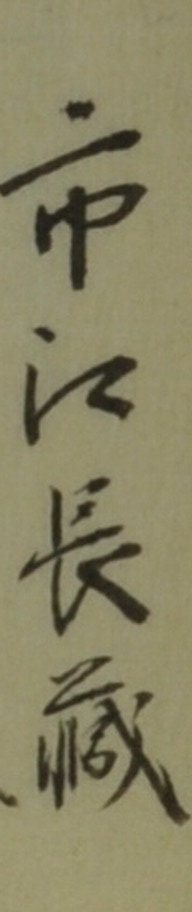市江長蔵
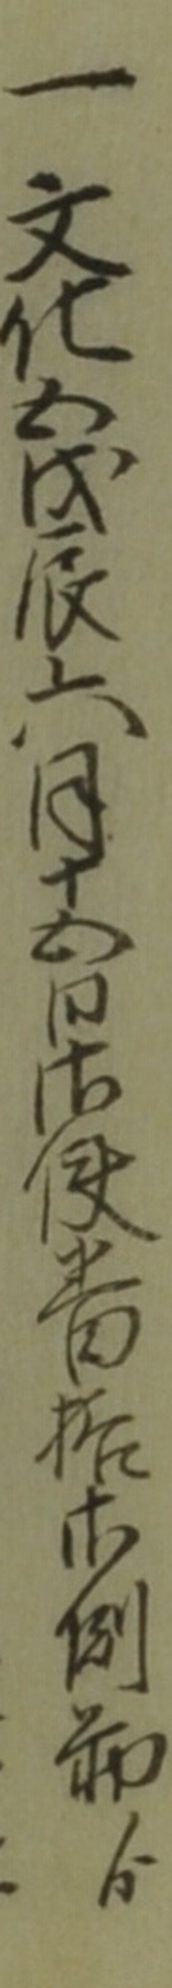一文化五戊辰六月十五日御使番格御側勤ゟ
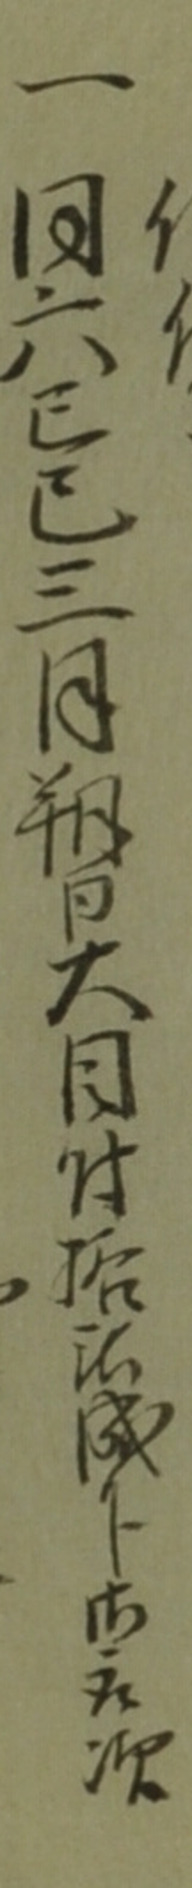一同六己巳三月朔日大目付格被成下御取次
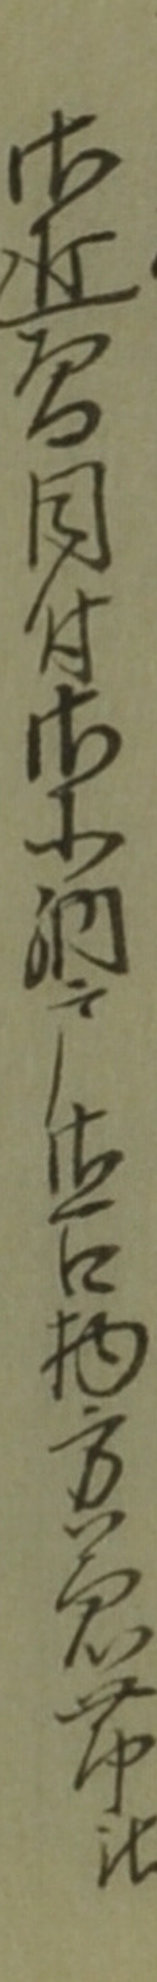御近習目付御小納戸御召物兼帯被
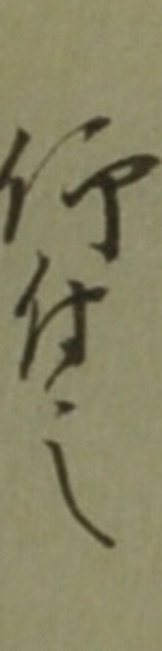仰付之
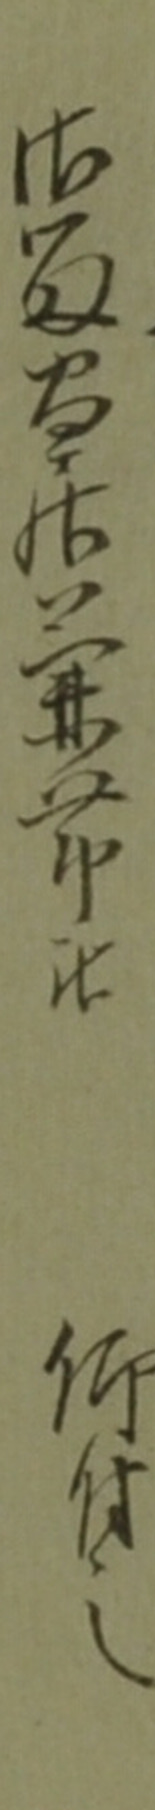御留守居兼帯被仰付之
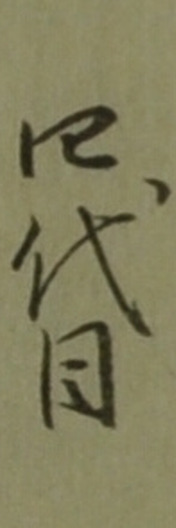四代目
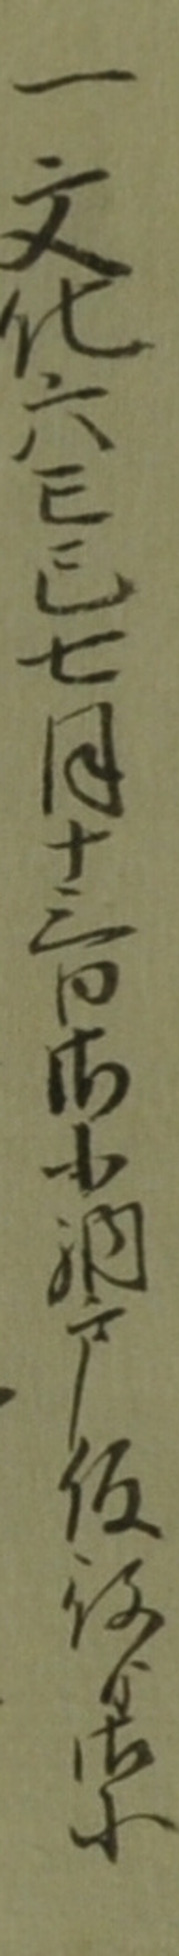一文化六己巳七月十三日御小納戸仮役ゟ御小
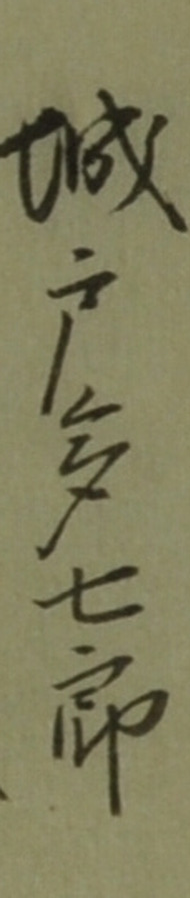城戸多七郎
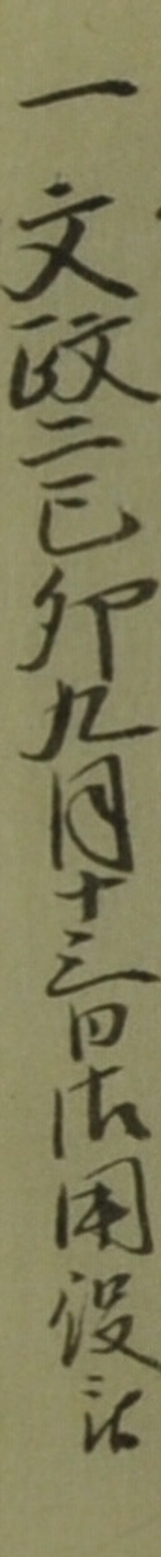一文政二巳卯九月十三日御用役被
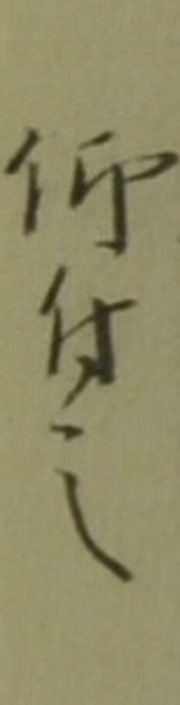仰付之
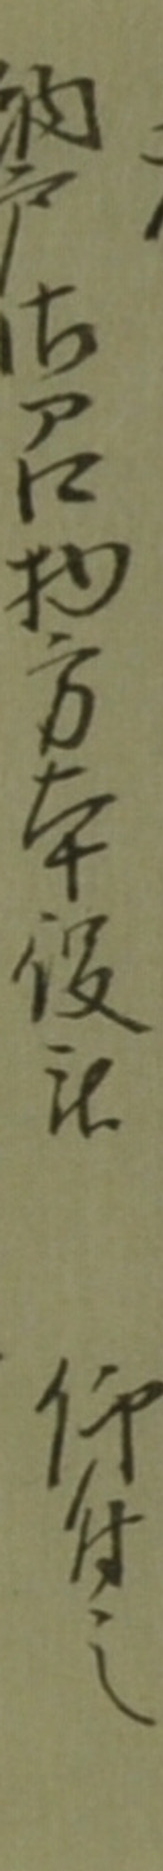納戸御召物方本役被仰付之

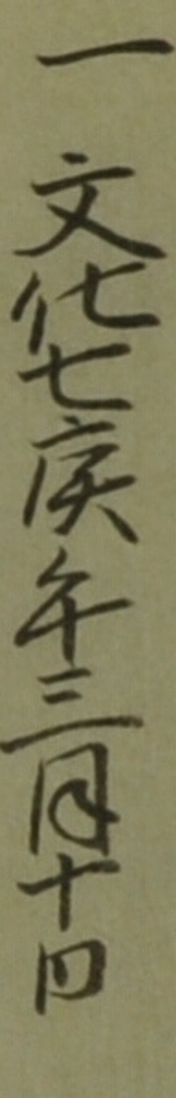一文化七庚午三月十日
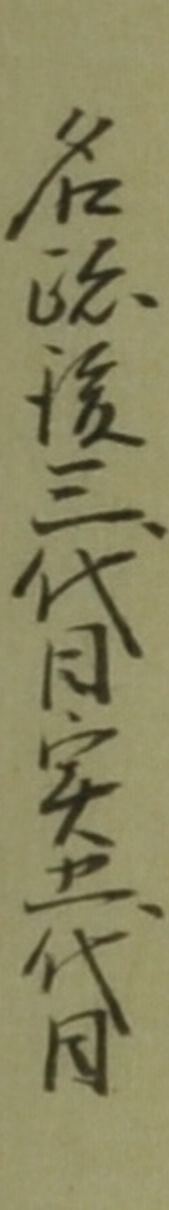名跡後三代目実五代目
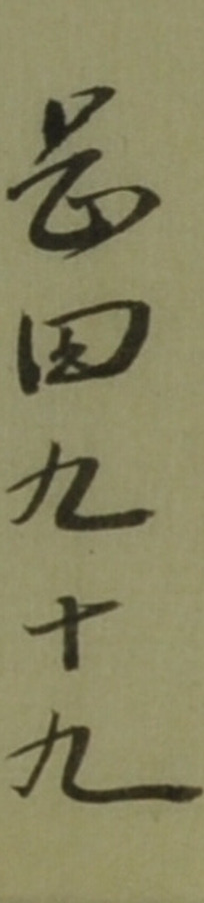岡田九十九
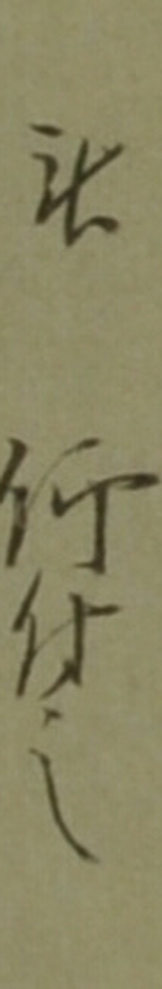被仰付之
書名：諸御役代々録（四）
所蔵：伊那市立高遠町図書館・合同会社AMANE
